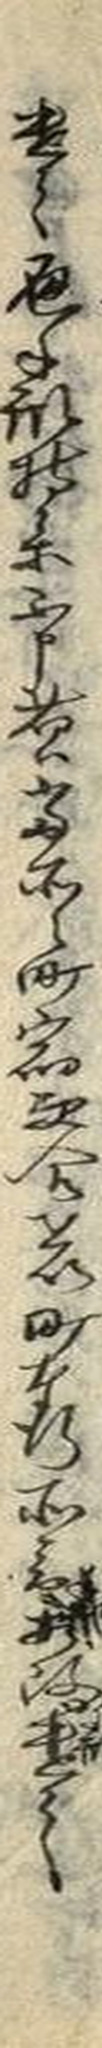遣之通手形持参不申者ハ当所之町宿受合を以町奉行所ニ而手形相改手形遣之
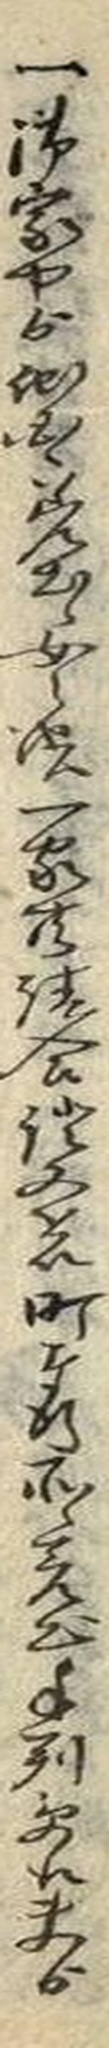一御家中ゟ他国へ差出候女之儀ハ一家共請合証文を以町奉行所へ差出手判受取夫ゟ
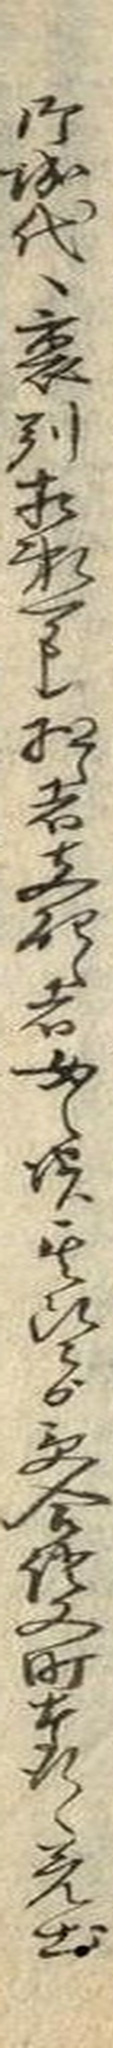御城代へ裏判相頼可申候組之者支配之者女之儀ハ其頭々ゟ受合証文町奉行所へ差出
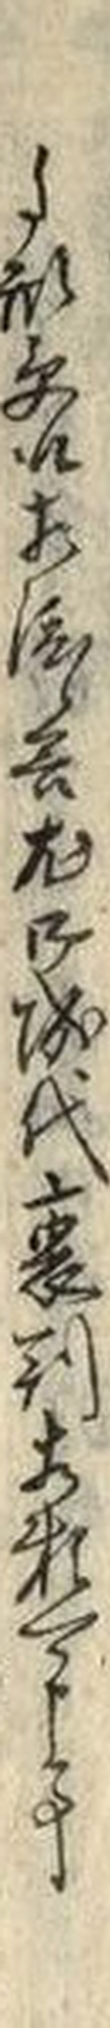手形受取相渡候筈尤御城代裏判相頼可申事
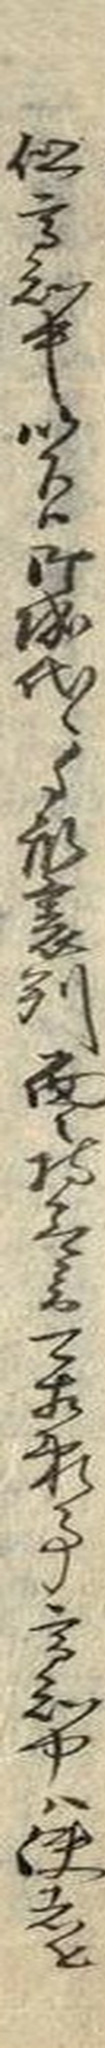但高知中以下ハ御城代へ手形裏判面々持参ニ而可相頼事高知中ハ使者を
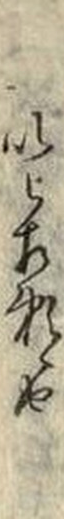以被相頼候由
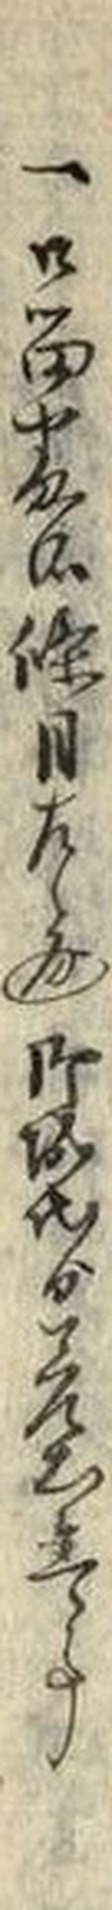一口留番所條目左之通御城代ゟ差出置候事

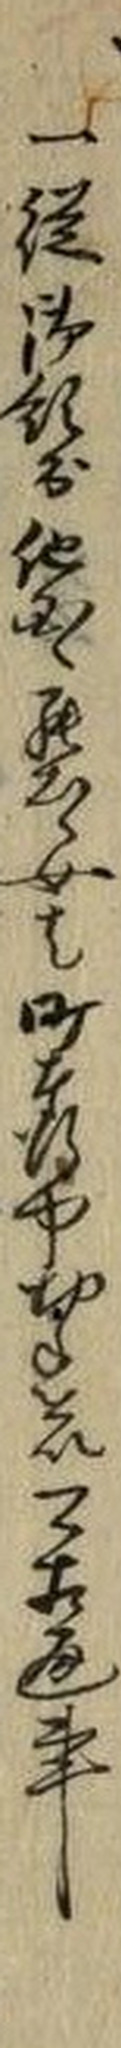一従御領分他国へ罷出候女者町奉行中切手を以可相通事
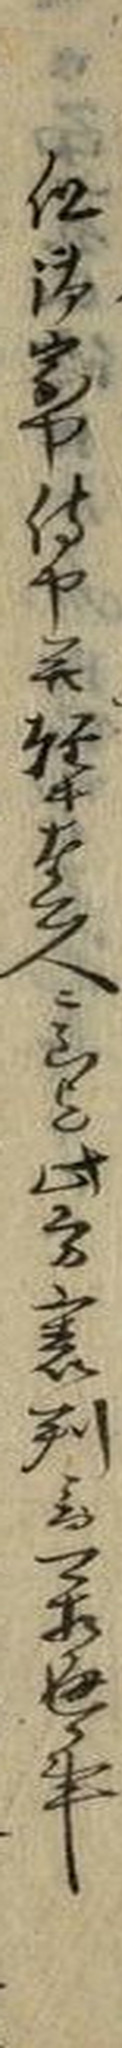但御家中侍中幷軽キ奉公人ニ至迄此方裏判ニ而可相通候事
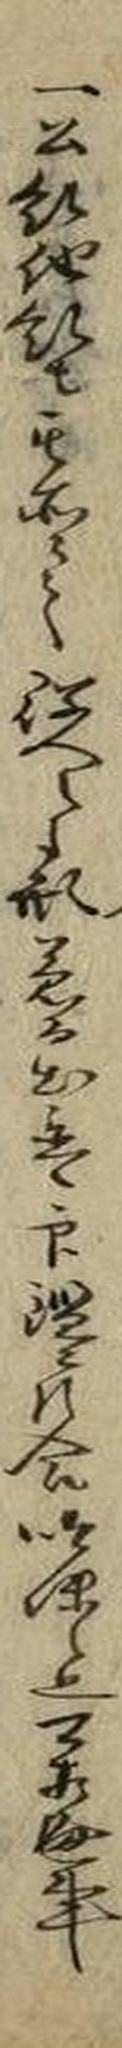一公領他領者其所々之役人之手形兼而出置候印鑑ニ引合吟味之上可相通事
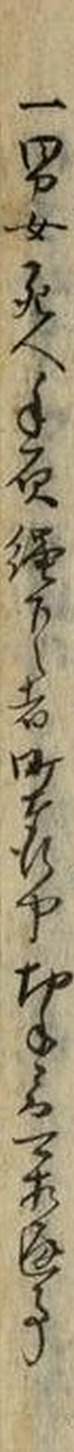一男女死人手負縄下之者町奉行中切手ニ而可相通事
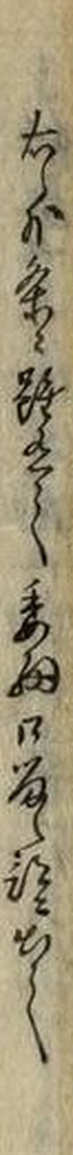右之外条々雖有之委細口留之部ニ出之
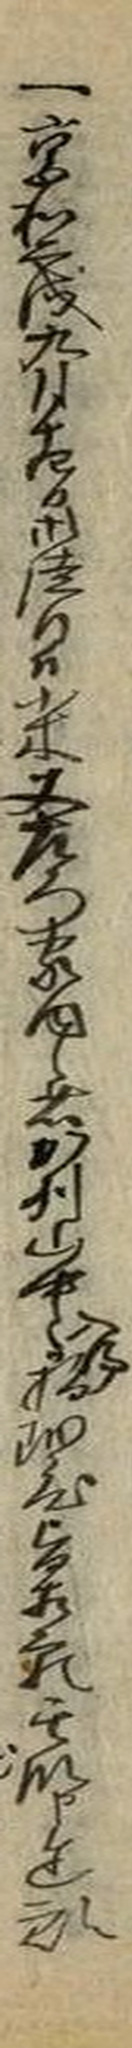一享和二戌九月十四日御徒目付小木文左衛門家内之者加州山中へ入湯指越度旨相願其段申達願
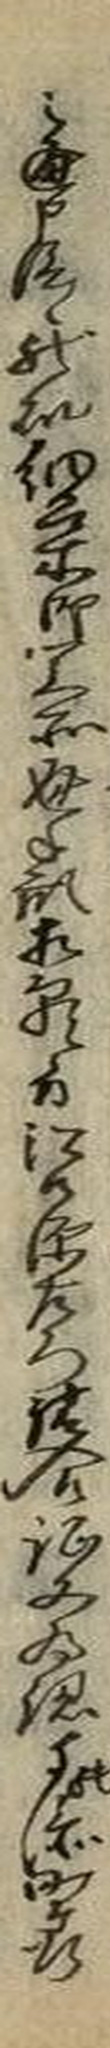之通申渡候然処細呂木御関所通手形相願候ニ付江口源左衛門請合証文為認手紙添町奉行
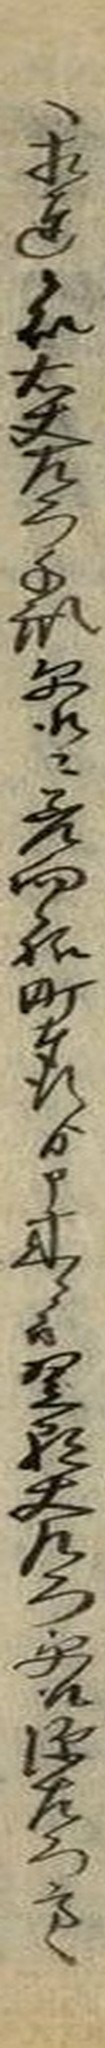へ相達候処右文左衛門手形受取ニ差向候様町奉行ゟ申来候ニ付翌朝文左衛門受取源左衛門方へ
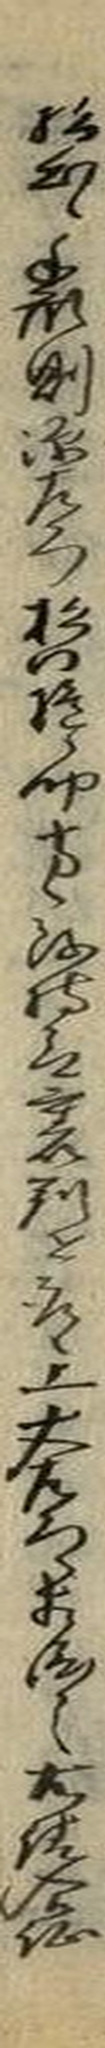指出候手形則源左衛門杉田権之助方へ致持参裏判を取候上文左衛門へ相渡之尤請合証
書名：御国他国諸事之部
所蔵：福井県文書館 Fukui Prefectural Archives
